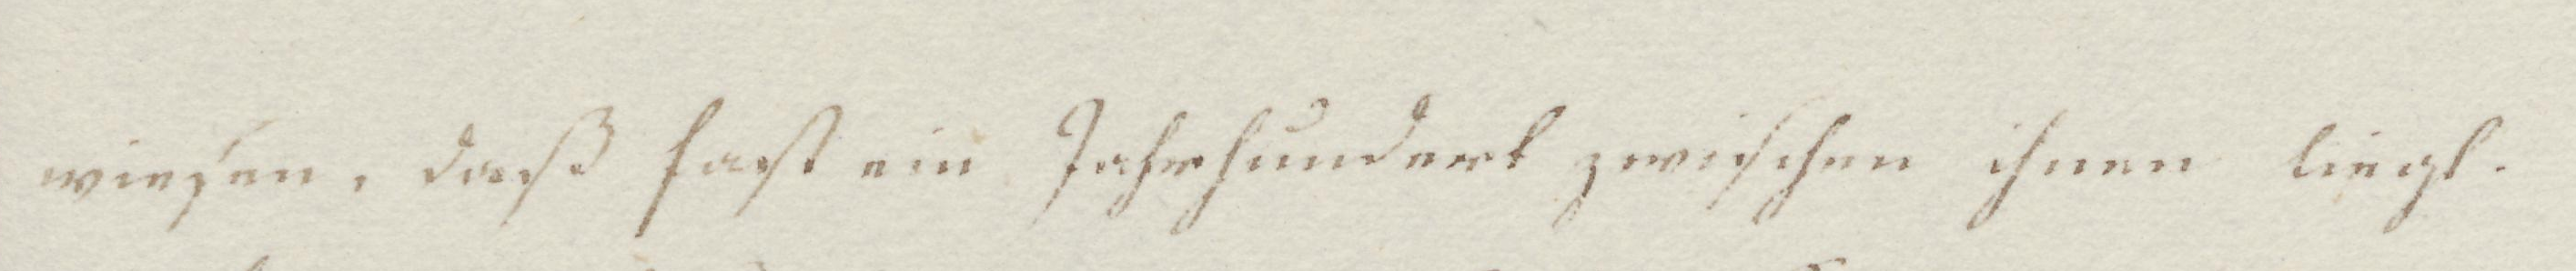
wiesen, daß fast ein Jahrhundert zwischen ihnen liegt.
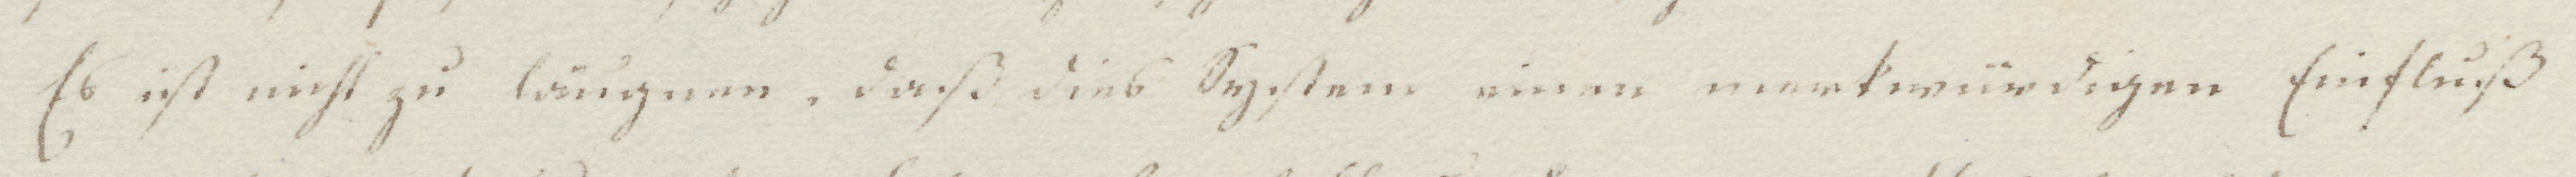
Es ist nicht zu läugnen, daß dies System einen merkwürdigen Einfluß
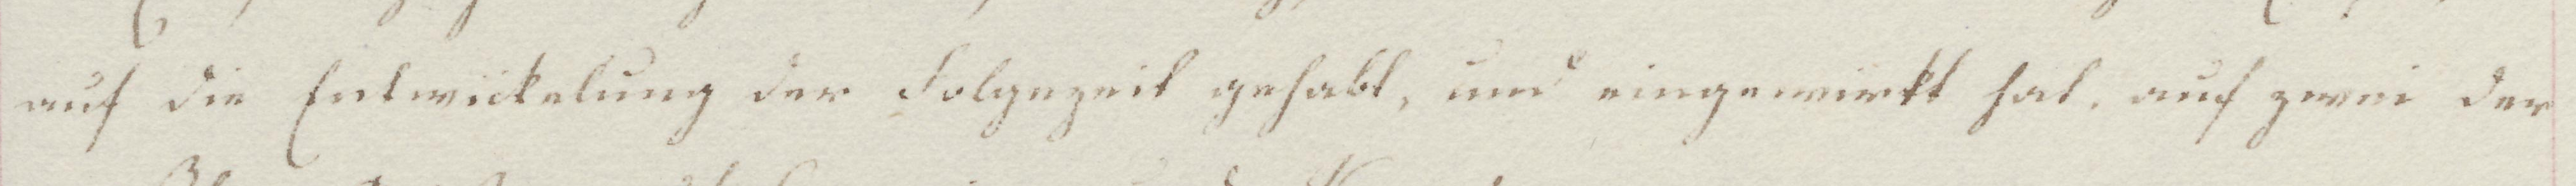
auf die Entwickelung der Folgezeit gehabt, und eingewirkt hat, auf zwei der
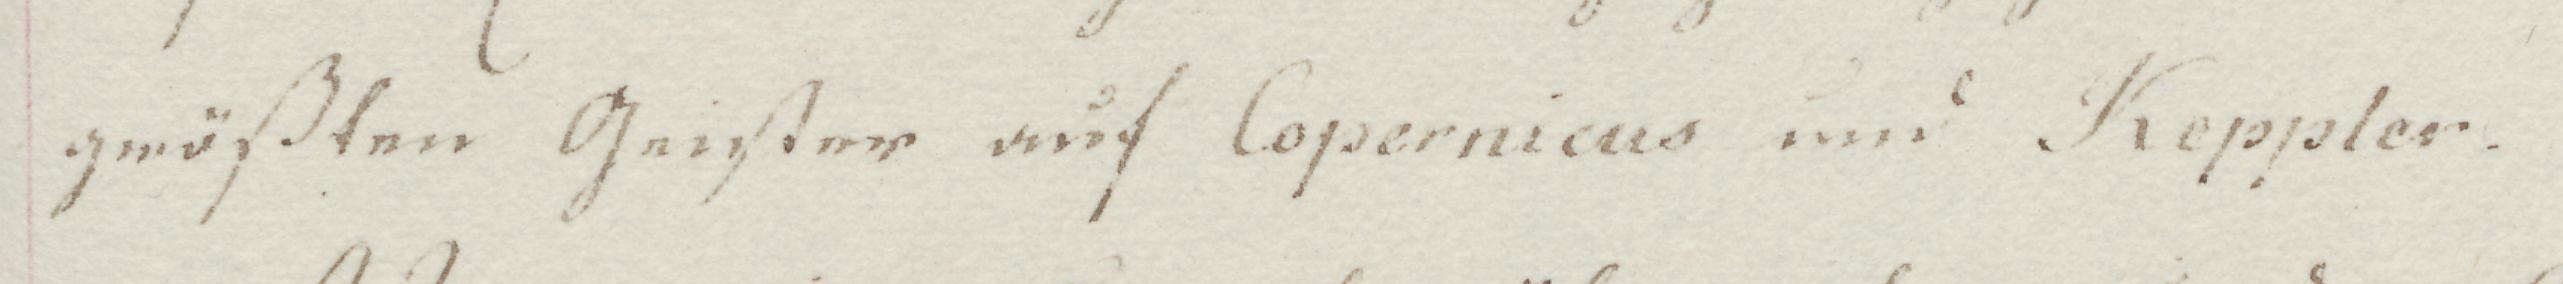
größten Geister auf Copernicus und Keppler.
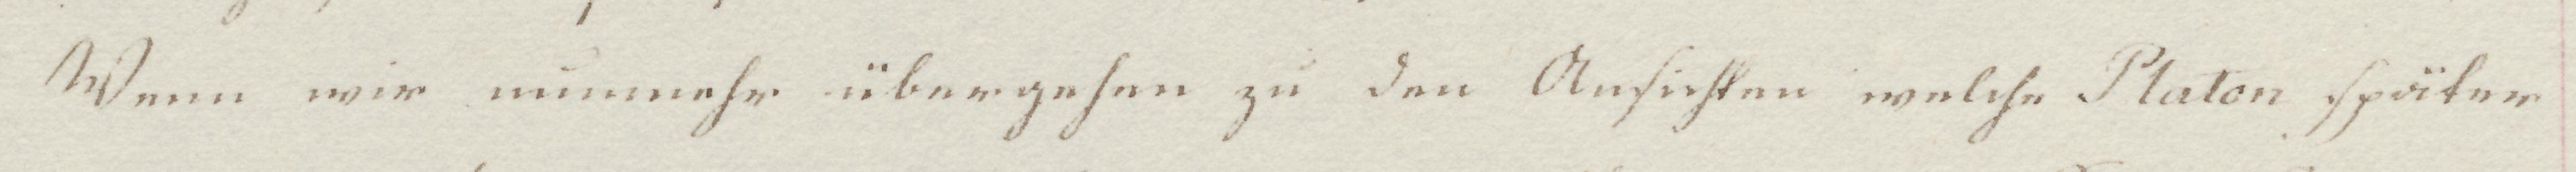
Wenn wir nunmehr übergehen zu den Ansichten welche Platon später
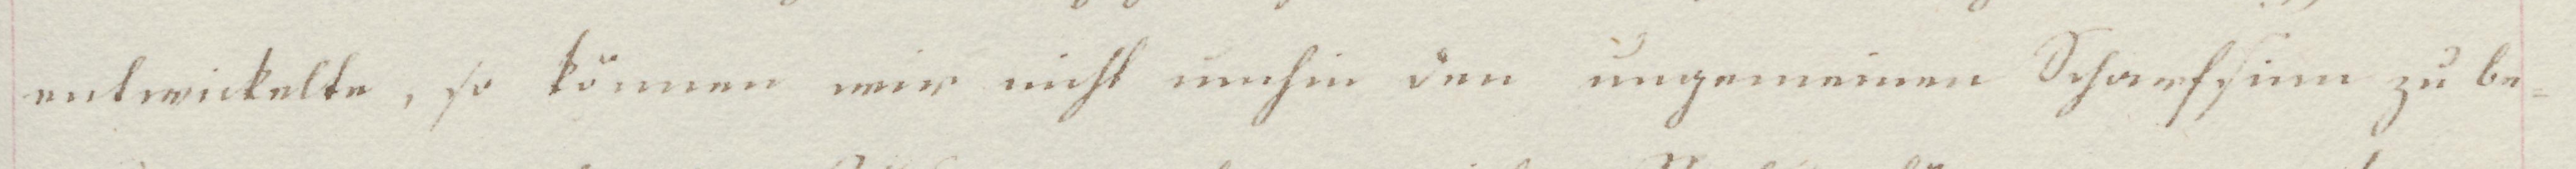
entwickelte, so können wir nicht umhin den ungemeinen Scharfsinn zu be-
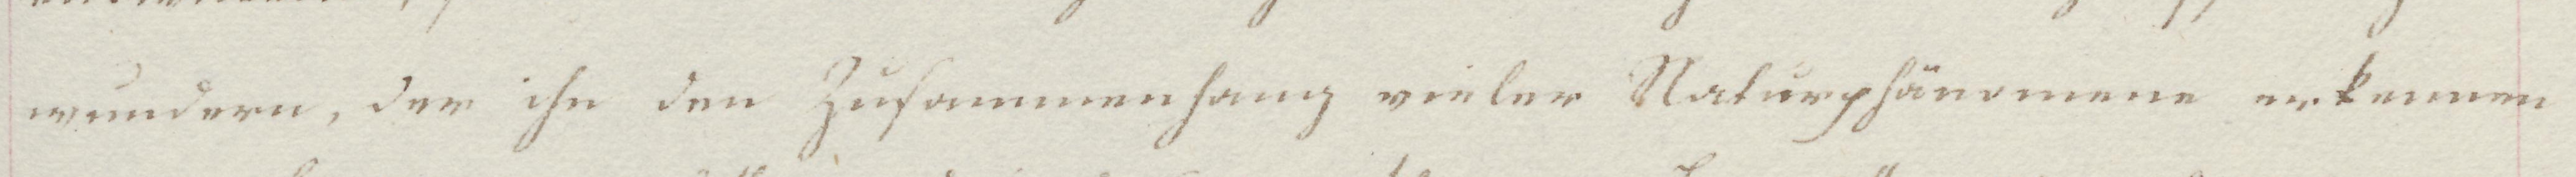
wundern, der ihn den Zusammenhang vieler Naturphänomene erkennen
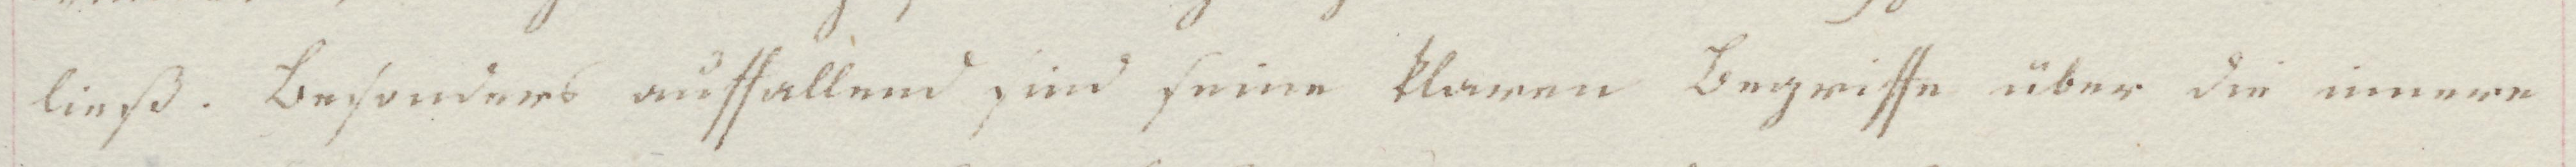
ließ. Besonders auffallend sind seine klaren Begriffe über die innere
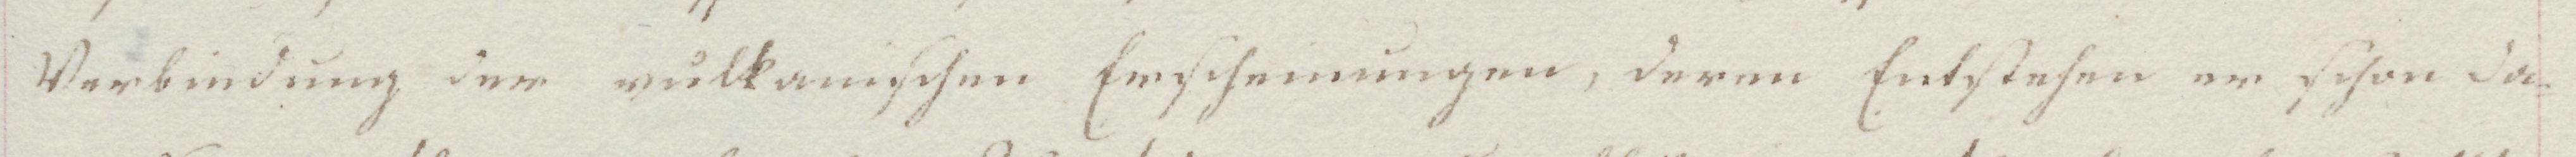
Verbindung der vulkanischen Erscheinungen, deren Entstehen er schon da-
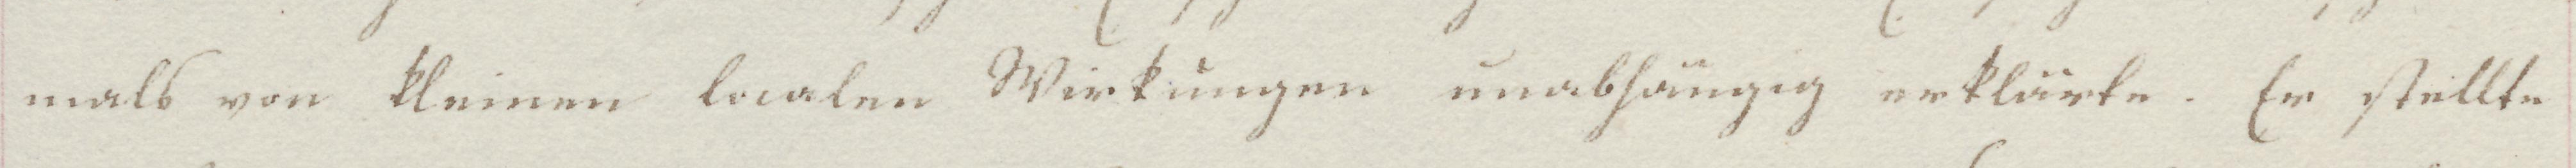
mals von kleinen localen Wirkungen unabhängig erklärte. Er stellte
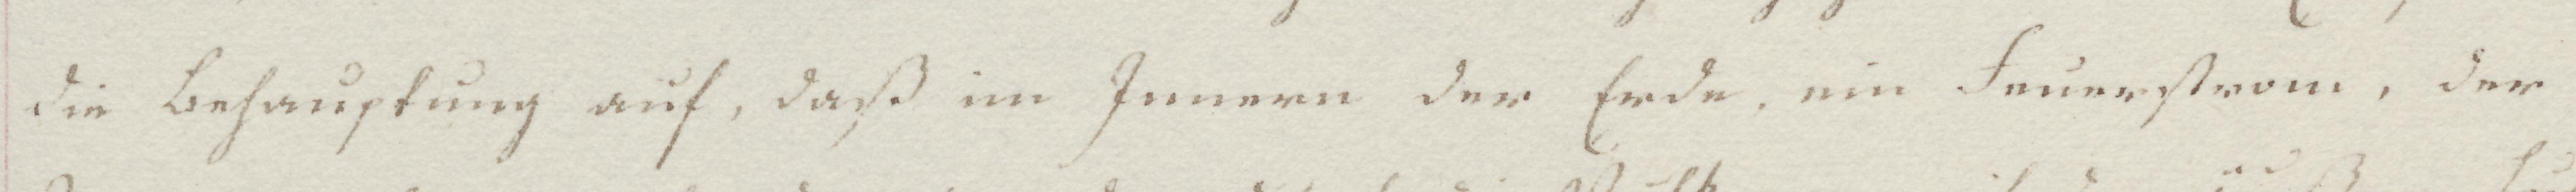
die Behauptung auf, daß im Innern der Erde ein Feuerstrom, der
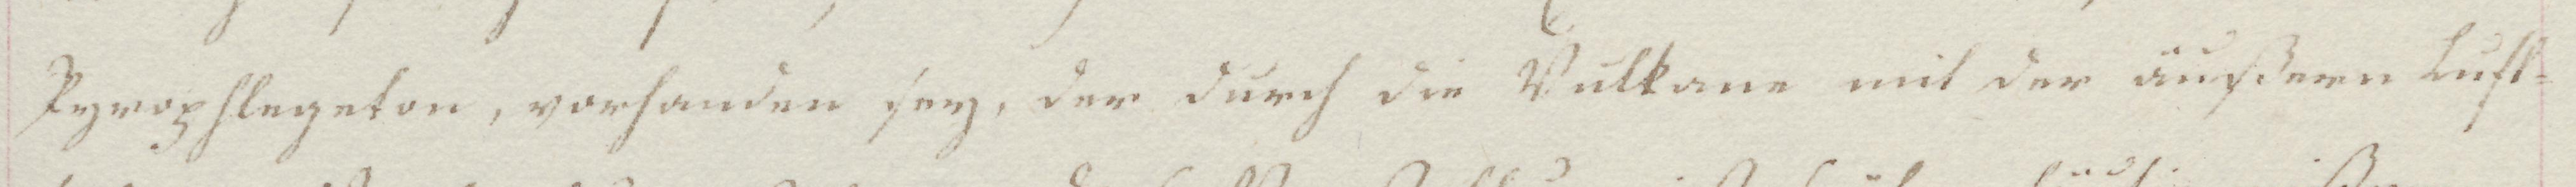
Pyrophlegeton, vorhanden sey, der durch die Vulkane mit der äußern Luft-
